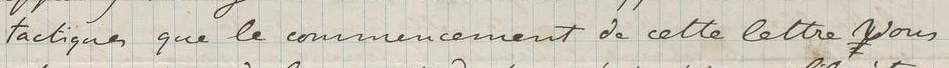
tactiques que le commencement de cette lettre Vous
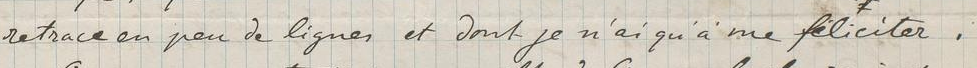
retrace en peu de lignes et dont je n'ai qu'à me féliciter.
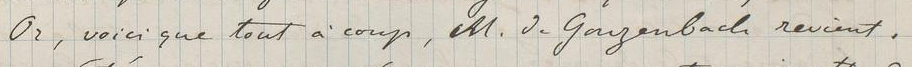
Or, voici que tout à coup, M. de Gonzenbach revient.
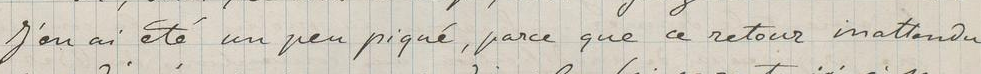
J'en ai été un peu piqué, parce que ce retour inattendu
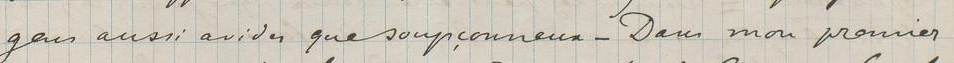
gens aussi avides que soupçonneux – Dans mon premier
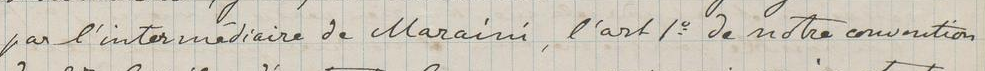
par l'intermédiaire de Maraini, l'art 1o de notre convention
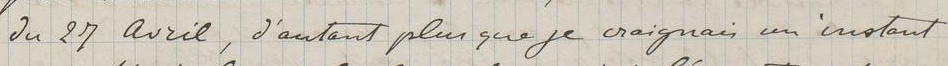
du 27 Avril, d'autant plus que je craignais un instant
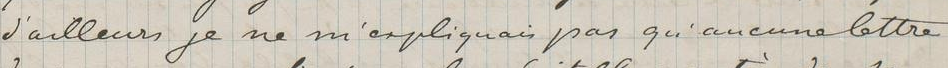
d'ailleurs je ne m'expliquais pas qu'aucune lettre
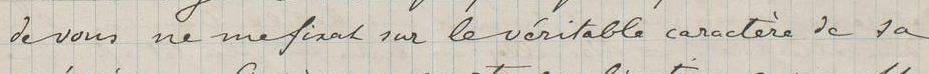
de vous ne me fixat sur le véritable caractère de sa
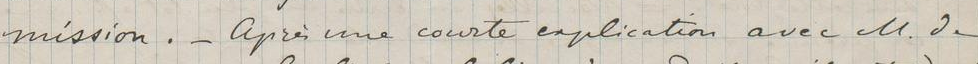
mission. – Après une courte explication avec M. de
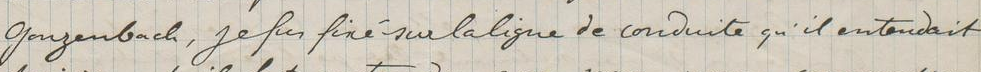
Gonzenbach, je fus fixé sur la ligne de conduite qu'il entendait
